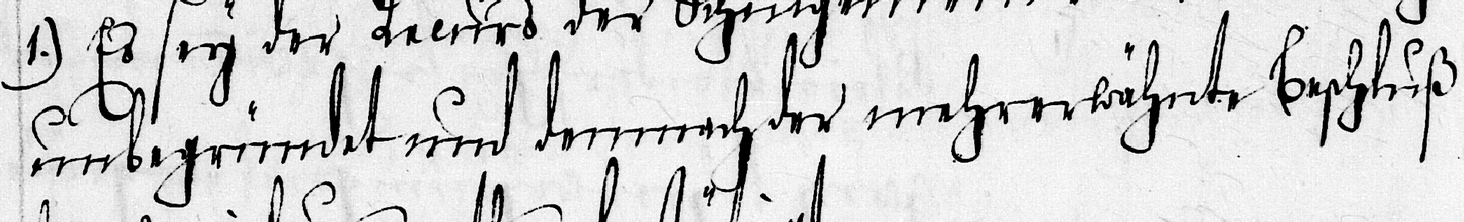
unbegründet und demnach der mehrerwähnte Beschluß
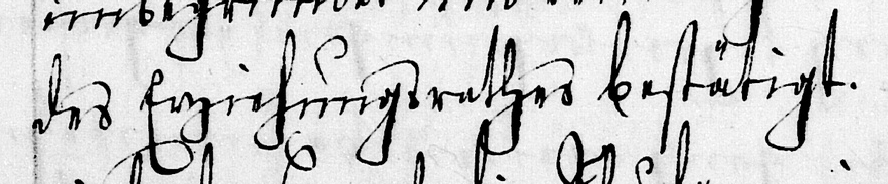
des Erziehungsrathes bestätigt.
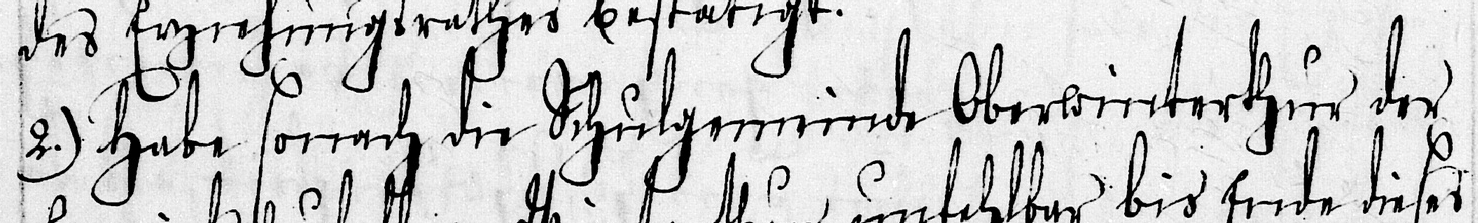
2.) Habe sonach die Schulgemeinde Oberwinterthur der
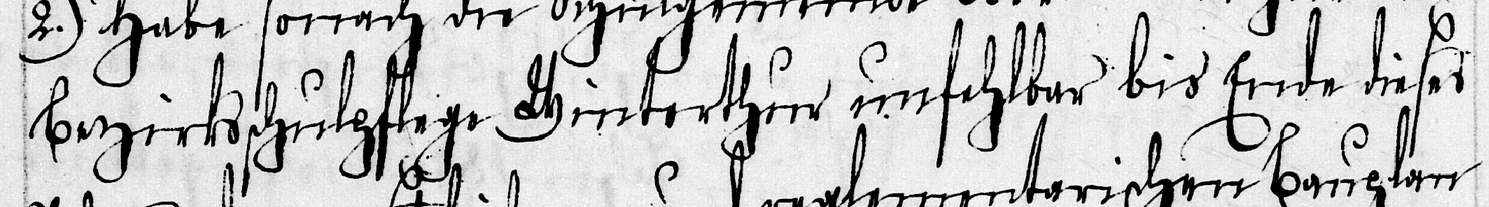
Bezirksschulpflege Winterthur unfehlbar bis Ende dieses
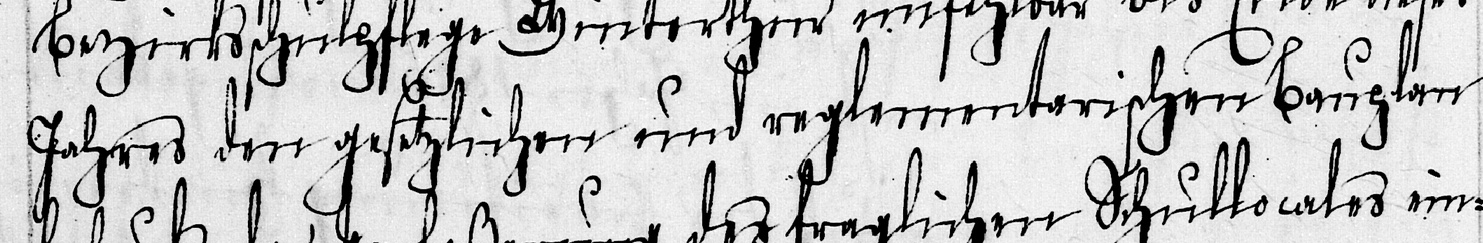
Jahres den gesetzlichen und reglementarischen Bauplan
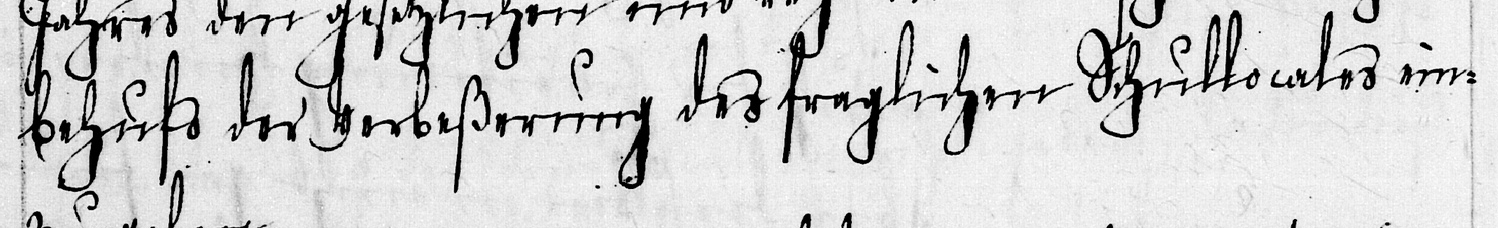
Behufs der Verbeßerung des fraglichen Schullocales ein¬
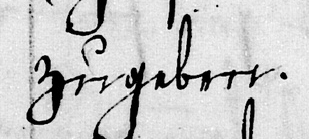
zugeben.
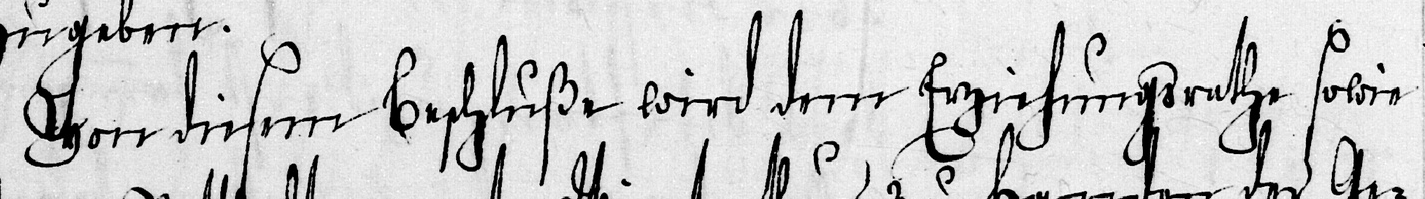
Von diesem Beschluße wird dem Erziehungsrathe sowie
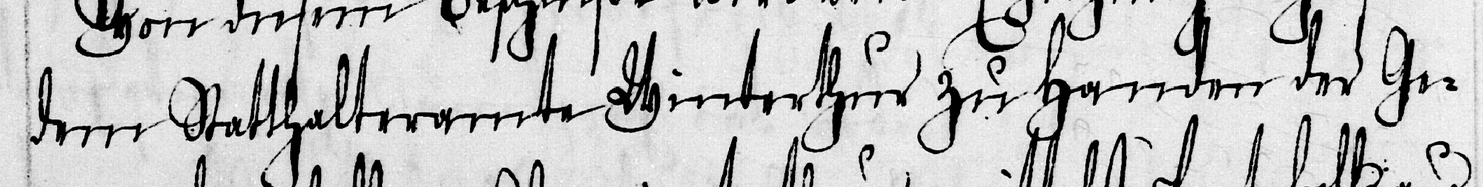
dem Statthalteramte Winterthur zu Handen der Ge¬
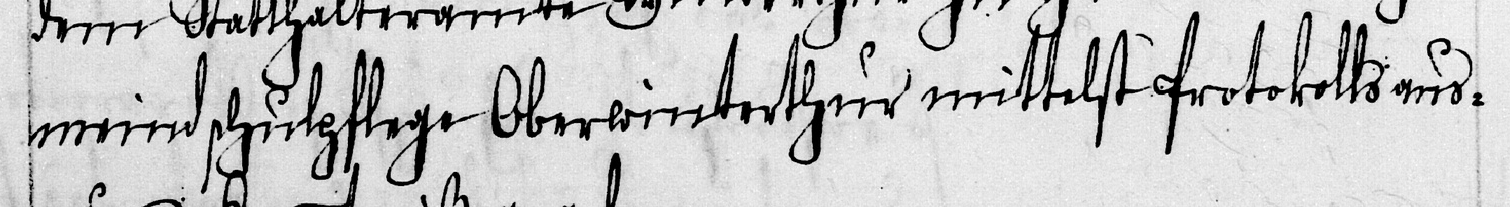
meindschulpflege Oberwinterthur mittelst Protokollsaus¬
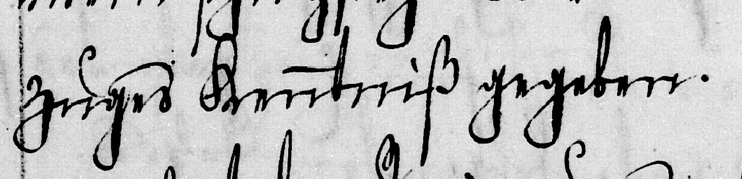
zuges Kenntniß gegeben.
